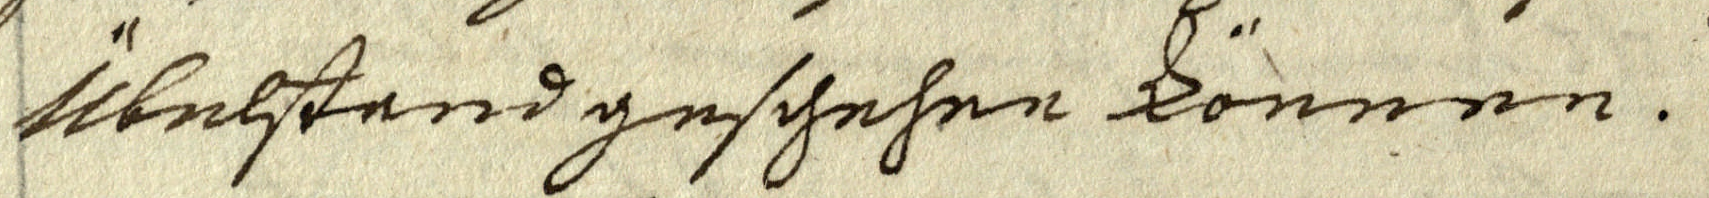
Übelstand geschehen können.
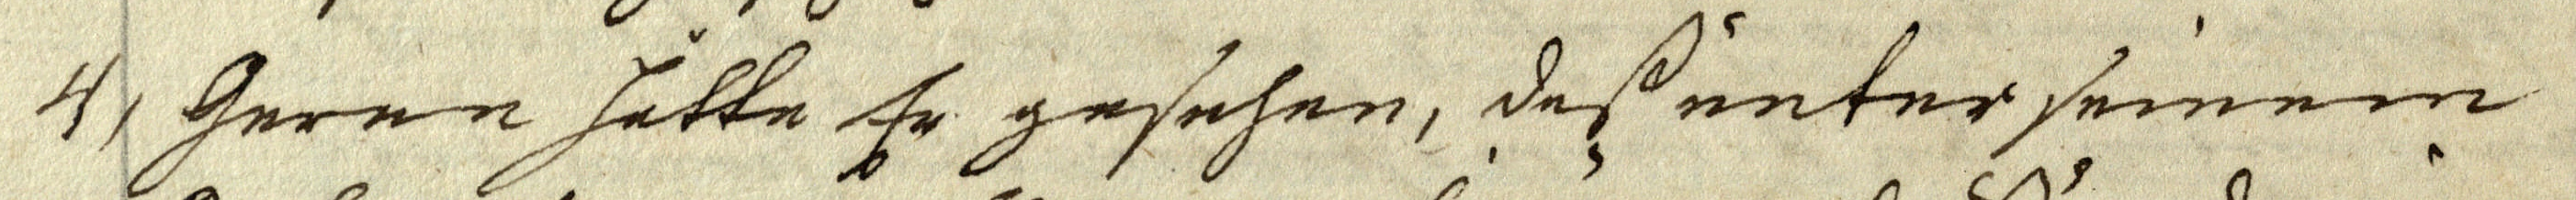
4, Gerne hätte Er gesehen, daß unter seinem
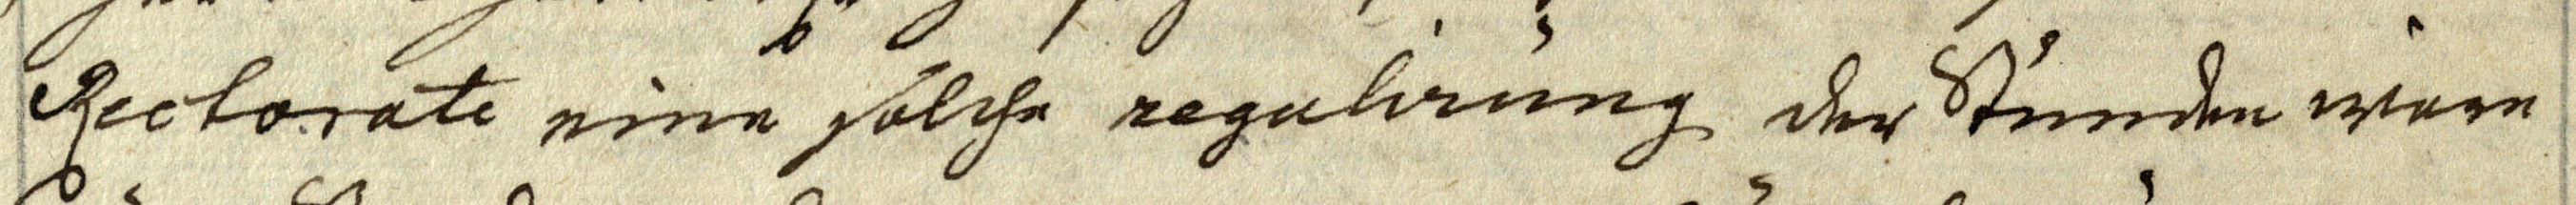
Rectorate eine solche regulirung der Stunden wäre
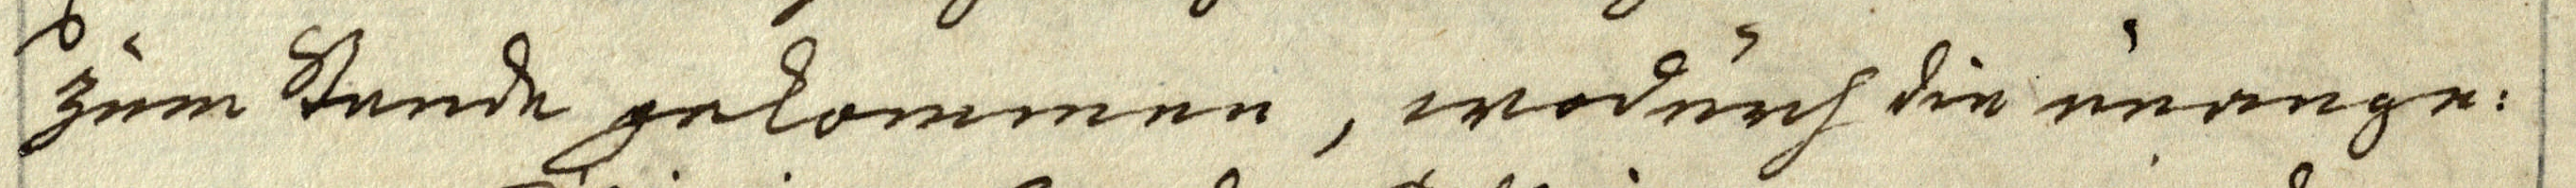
zum Stande gekommen, wodurch die unange¬
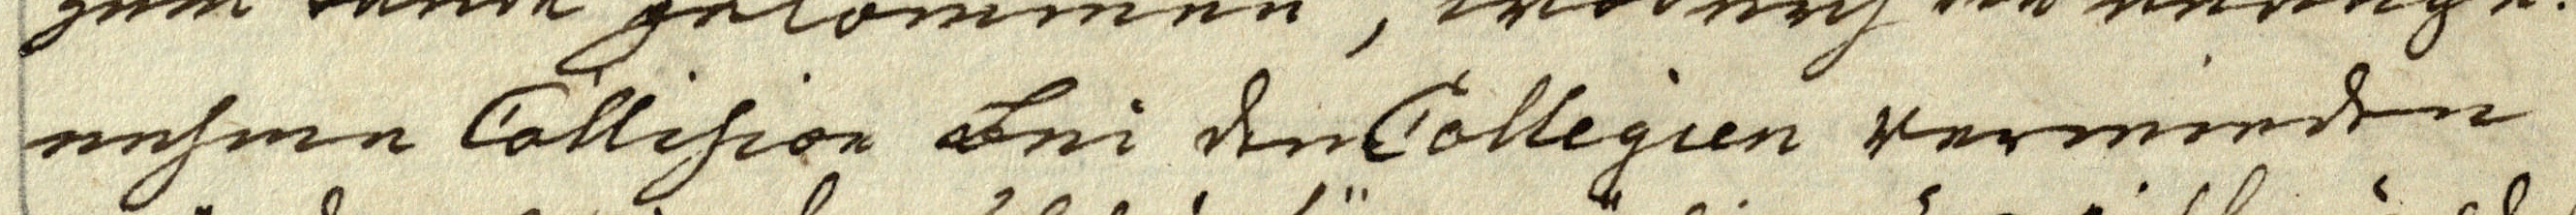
nehme Collision bei den Collegien vermieden
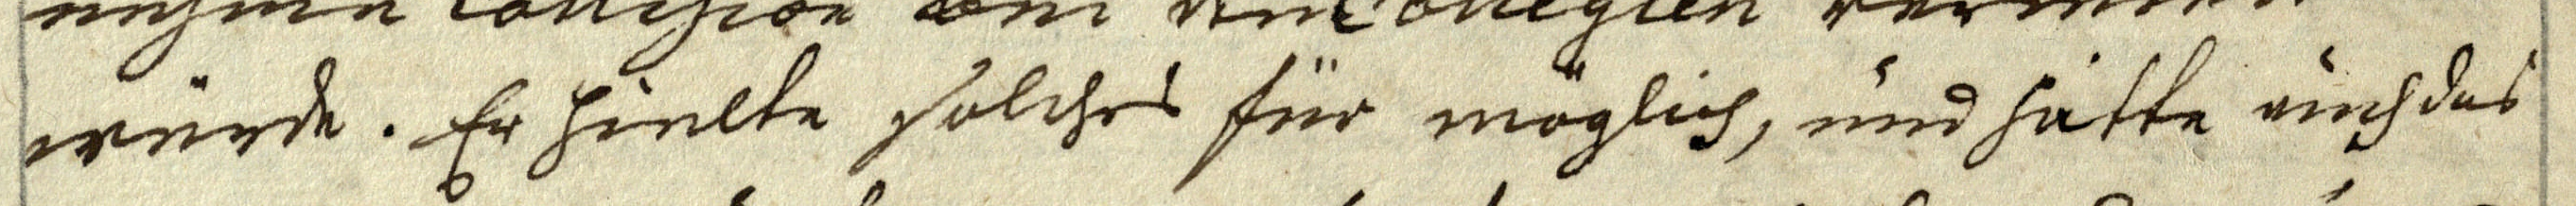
würde. Er hielte solches für möglich, und hätte auch das
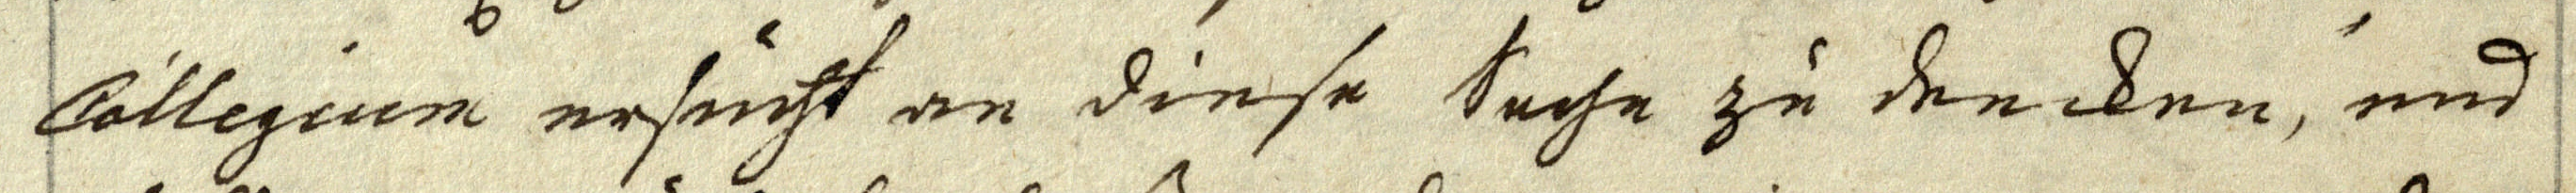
Collegium ersucht an diese Sache zu dencken, und
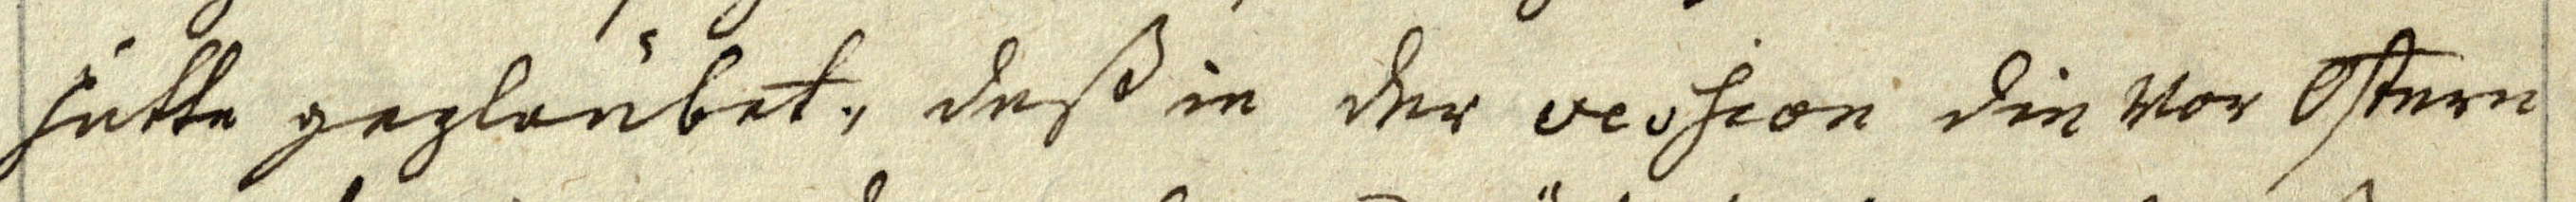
hätte geglaubet, daß in der session die vor Ostern
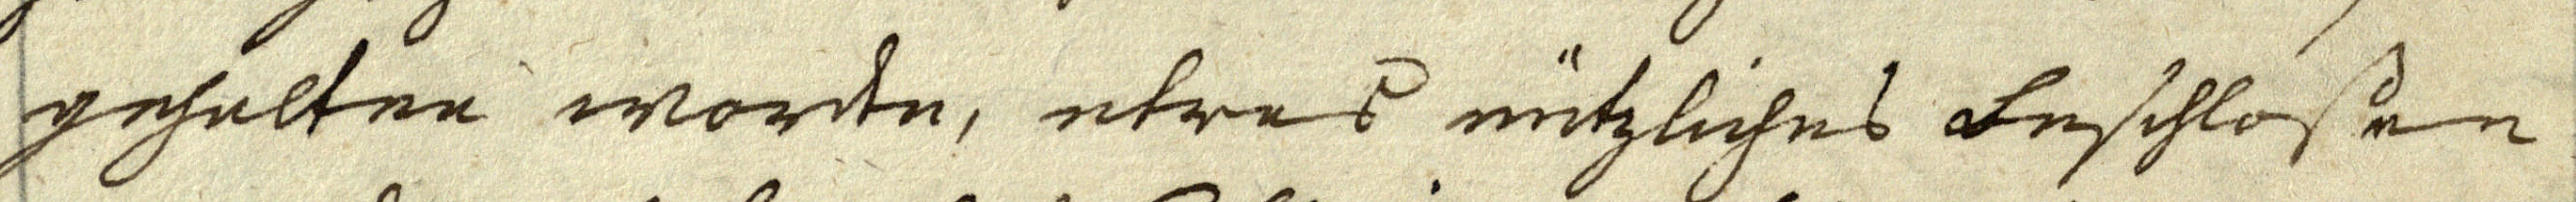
gehalten worden, etwas nützliches beschloßen
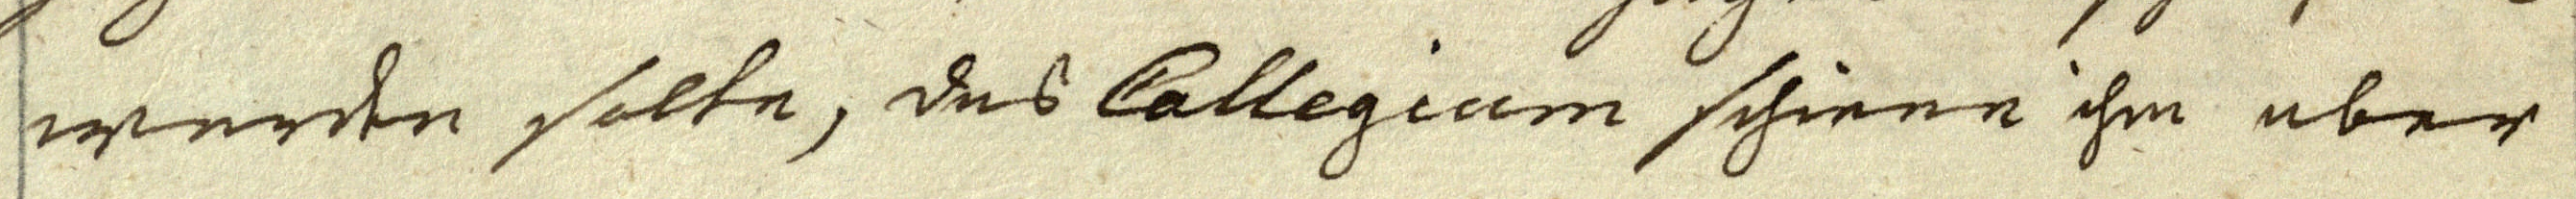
werden solte, das Collegium schiene ihm aber
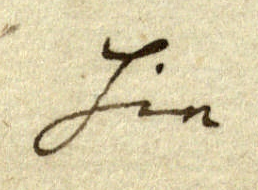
hie
